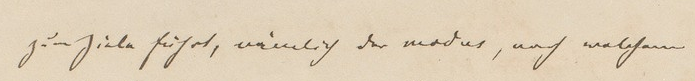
zum Ziele führt, nämlich der modus, nach welchem
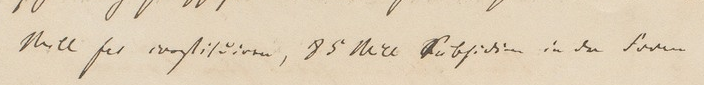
Mill Frs constituiren, 85 Mill Subsidien in der Form
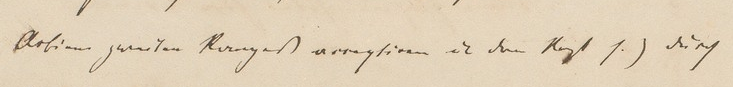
Actien zweiten Ranges acceptiren und den Rest sich durch
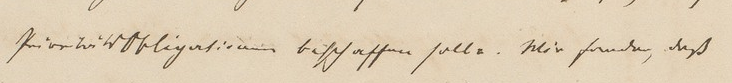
PrioritätsObligationen beschaffen solle. Wir fanden, daß
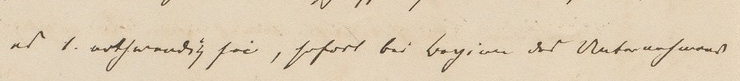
es 1. nothwendig sei, sofort bei Beginn des Unternehmens
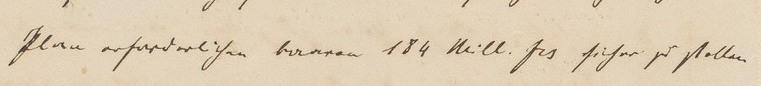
Plan erforderlichen baaren 184 Mill. Frs sicher zu stellen
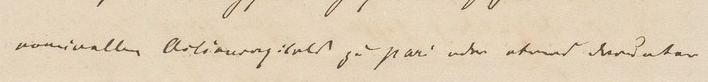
nominellen Actiencapitals zu pari oder etwas darunter
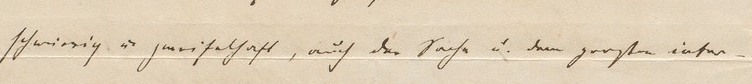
schwierig u zweifelhaft, auch der Sache u. dem großen inter-
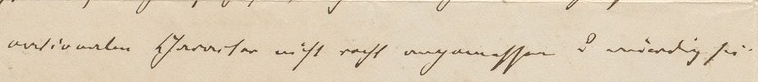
nationalen Charakter nicht recht angemessen u würdig sei.
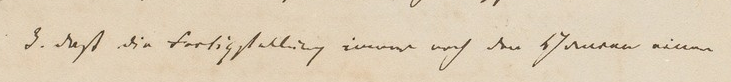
3. daß die Fertigstellung immer noch den Chancen einer
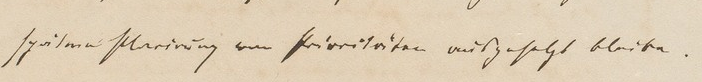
spätern Placirung von Prioritäten ausgesetzt bleibe.
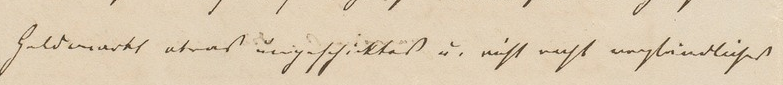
Geldmarkt etwas ungeschicktes u. nicht recht verständliches
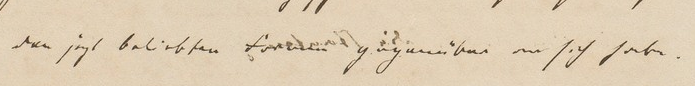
den jezt beliebten Formen gegenüber an sich habe.
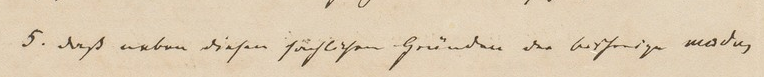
5. daß neben diesen sachlichen Gründen der bisherige modus
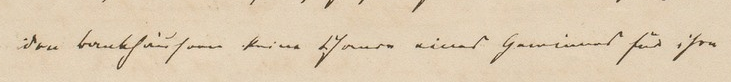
den Bankhäusern keine Chance eines Gewinnes für ihre
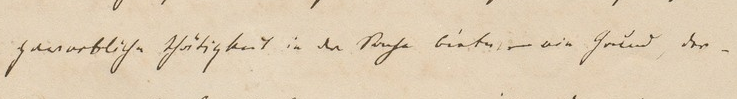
gewerbliche Thätigkeit in der Sache biete – ein Grund der –
